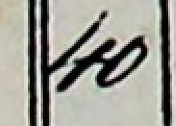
40
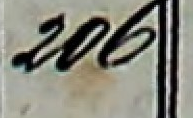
206
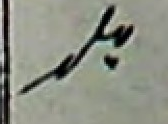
do
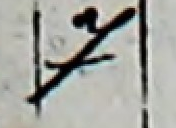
7
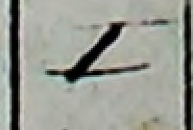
I
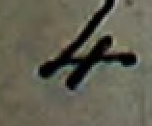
4
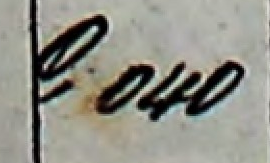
0,040
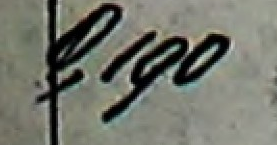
0,190
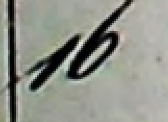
16
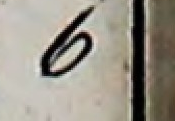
6
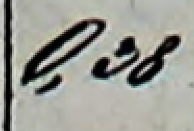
0,38
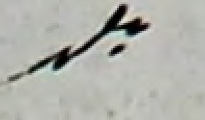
do
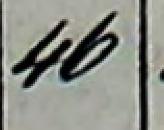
46
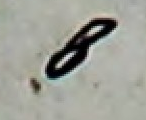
8
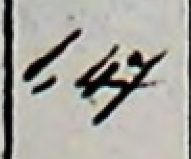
1,47
